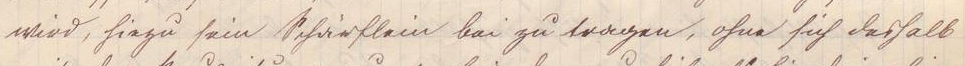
wird, hiezu sein Schärflein bei zu tragen, ohne sich deshalb
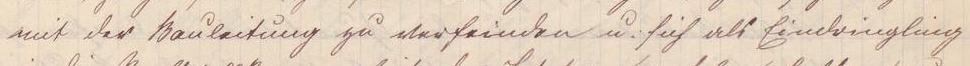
mit der Bauleitung zu verfeinden u. sich als Eindringling
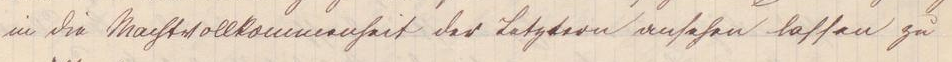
in die Machtvollkommenheit der Letztern ansehen lassen zu
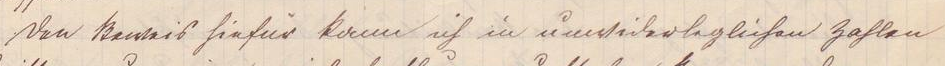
Den Beweis hiefür kann ich in unwiderleglichen Zahlen
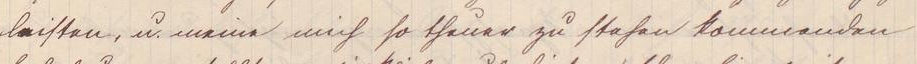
leisten, u. meine mich so theuer zu stehen kommenden
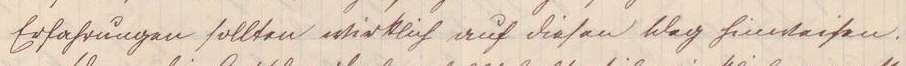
Erfahrungen sollten wirklich auf diesen Weg hinweisen.
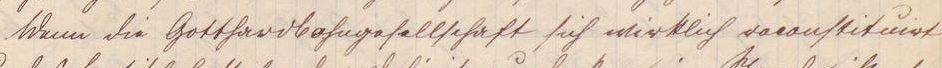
Wenn die Gotthardbahngesellschaft sich wirklich reconstituirt
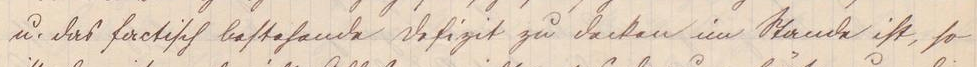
u. das factisch bestehende Defizit zu decken im Stande ist, so
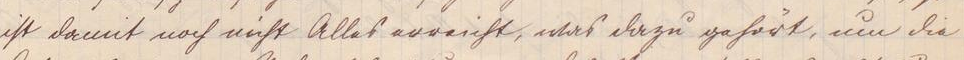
ist damit noch nicht Alles erreicht, was dazu gehört, um die
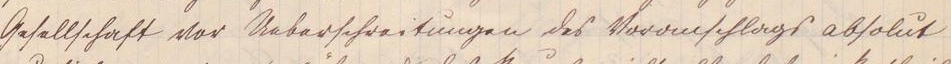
Gesellschaft vor Ueberschreitungen des Voranschlags absolut
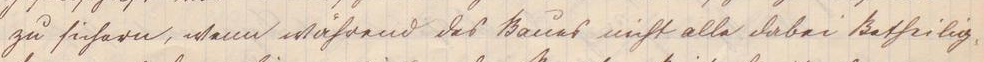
zu sichern, wenn während des Baues nicht alle dabei Betheilig-
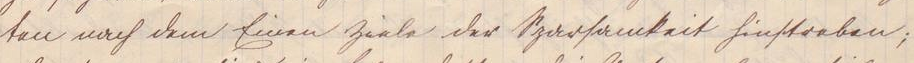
ten nach dem Einen Ziele der Sparsamkeit hinstreben;
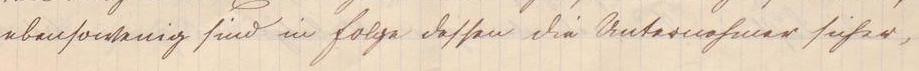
ebensowenig sind in Folge dessen die Unternehmer sicher,
